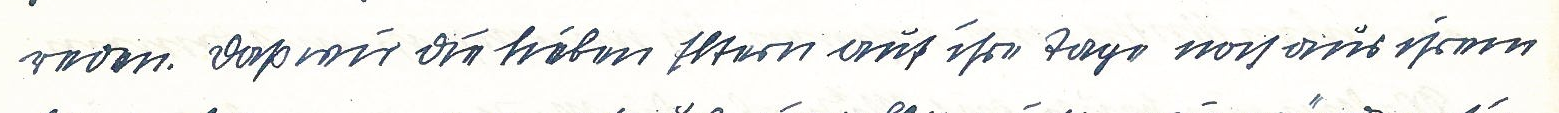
reden. Daß wir die lieben Eltern auf ihre Tage noch aus ihrem
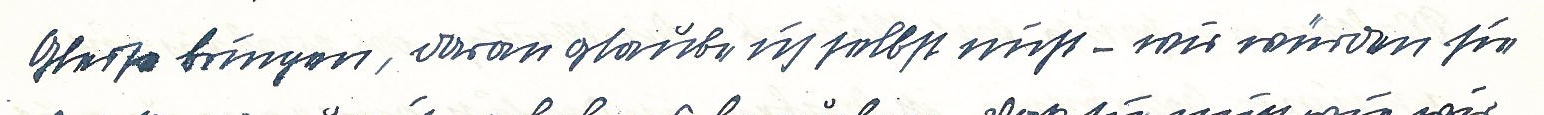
Gleise bringen, daran glaube ich selbst nicht – wir würden sie
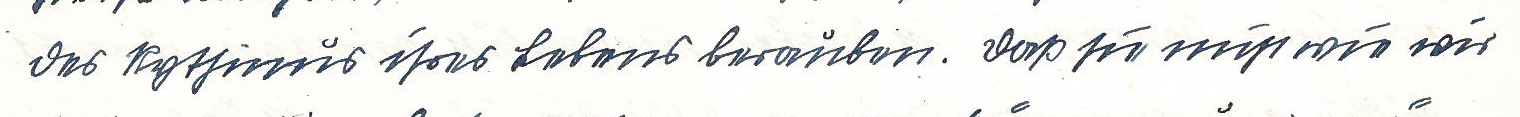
des Rythmus ihres Lebens berauben. Daß sie nicht wie wir
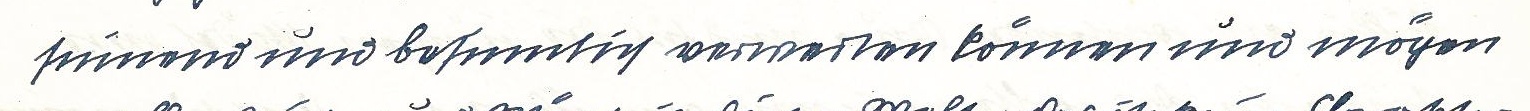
sinnend und besinnlich verweilen können und mögen
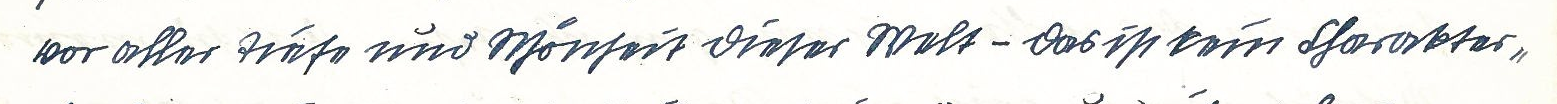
vor aller Tiefe und Schönheit dieser Welt – das ist kein Charakter¬
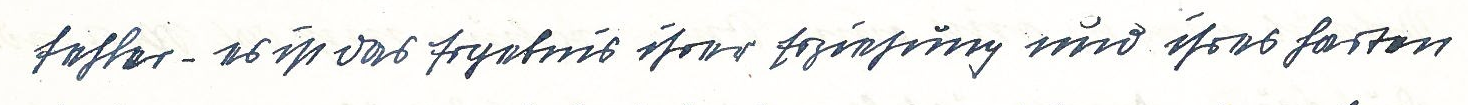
fehler – es ist das Ergebnis ihrer Erziehung und ihres harten
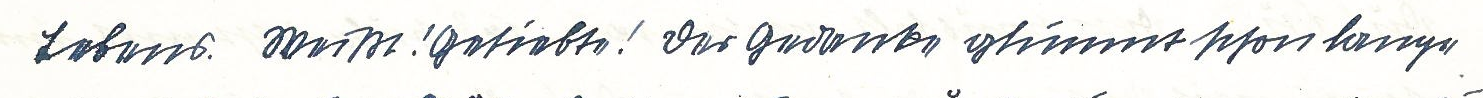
Lebens. Weißt! Geliebte! Der Gedanke glimmt schon lange
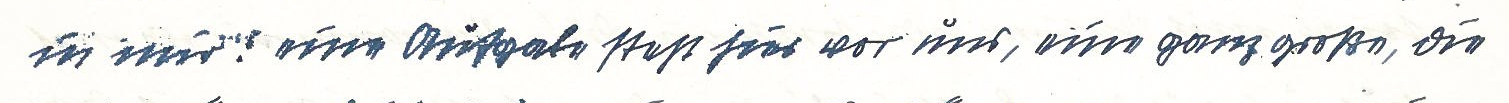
in mir! eine Aufgabe steht hier vor uns, eine ganz große, die
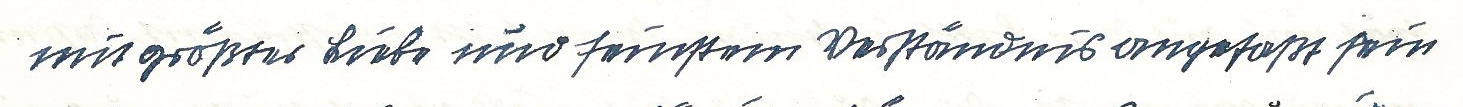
mit größter Liebe und feinstem Verständnis angefaßt sein
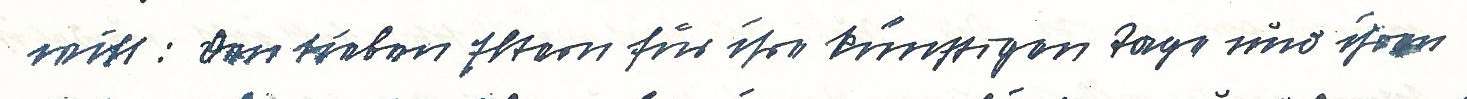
will: Den lieben Eltern für ihre künftigen Tage und ihren
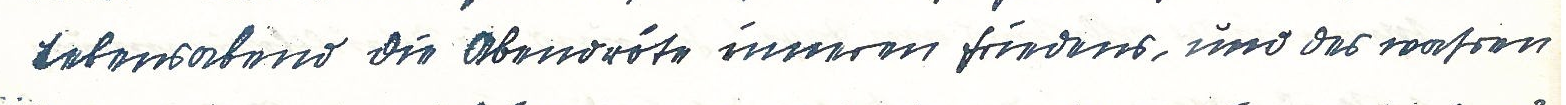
Lebensabend die Abendröte inneren Friedens, und des wahren
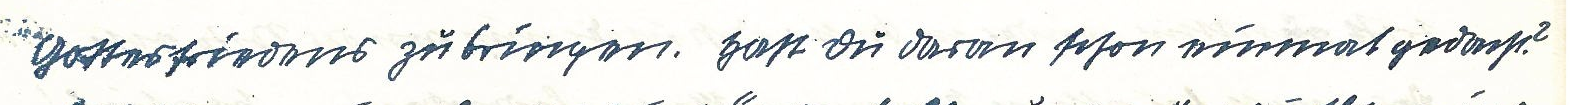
Gottesfriedens zu bringen. Hast Du daran schon einmal gedacht?
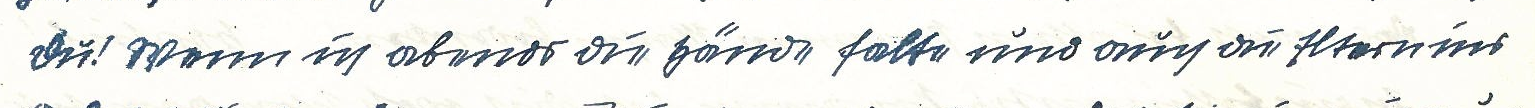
Du! Wenn ich abends die Hände falte und auch die Eltern ins
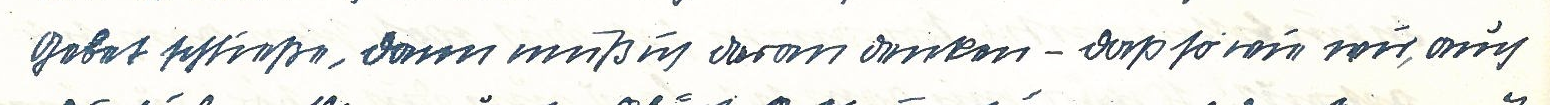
Gebet schließe, dann muß ich daran denken – daß so wie wir, auch
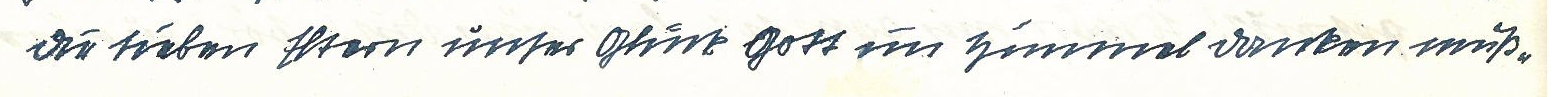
die lieben Eltern unser Glück Gott im Himmel danken muß¬
